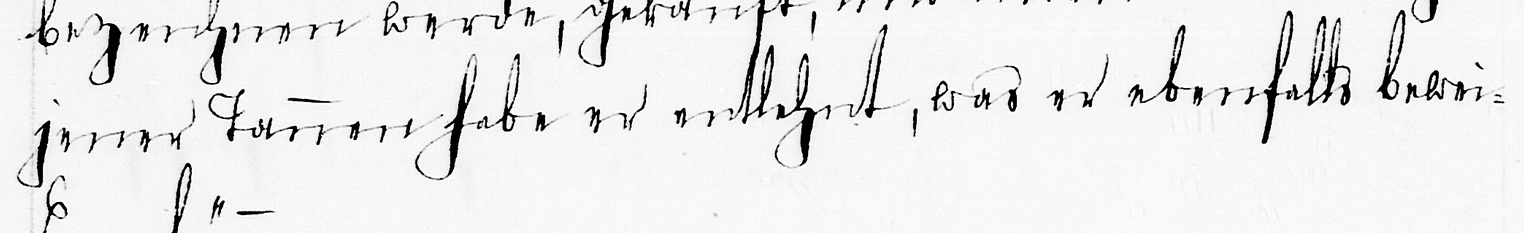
jener Tannen habe er entlehnt, was er ebenfalls bewei¬
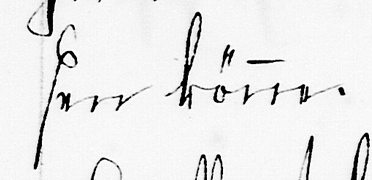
sen könne.
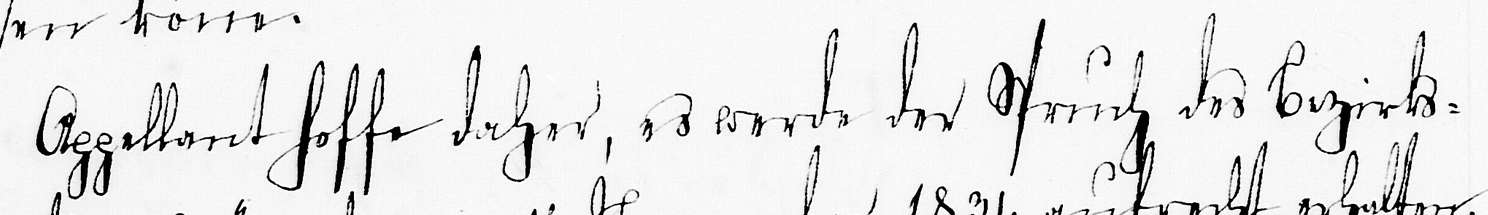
Appellant hoffe daher, es werde der Spruch des Bezirks¬
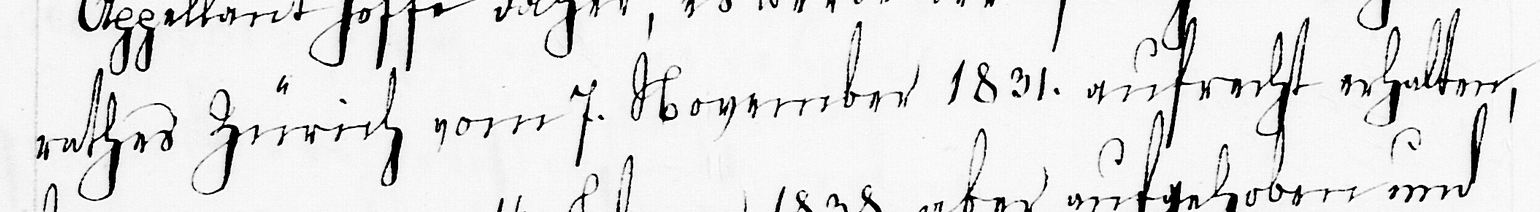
rathes Zürich vom 7. November 1831. aufrecht erhalten,
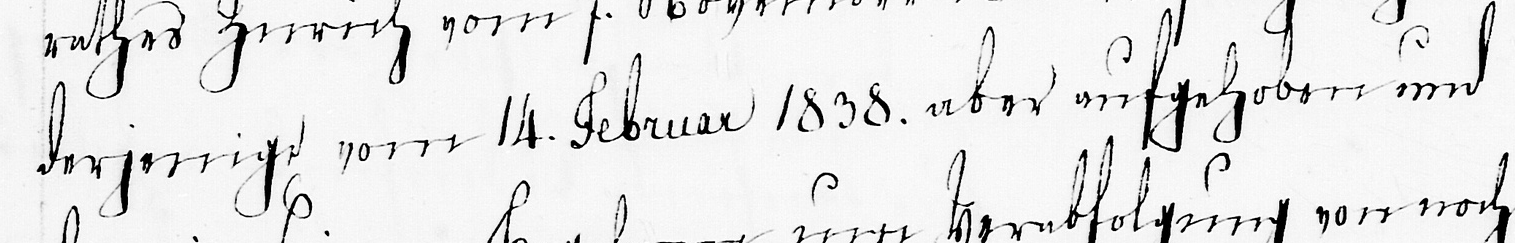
derjenige vom 14. Februar 1838. aber aufgehoben und
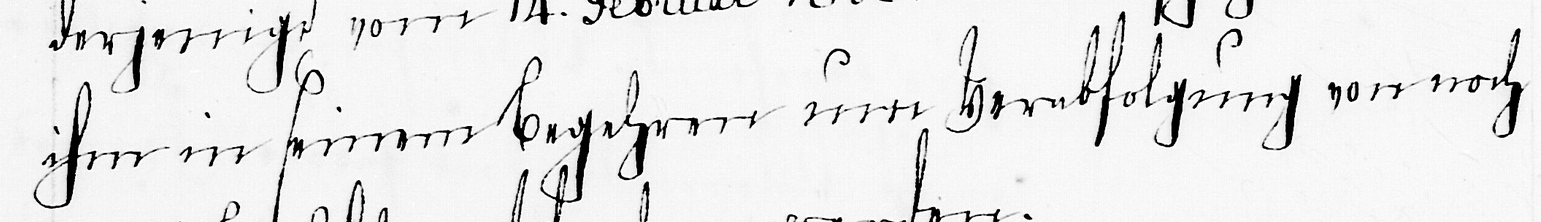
ihm in seinem Begehren um Verabfolgung von noch
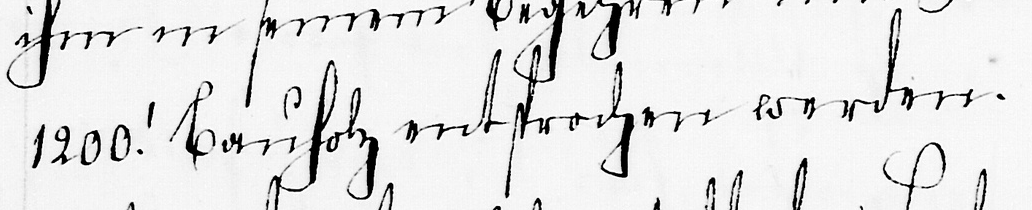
1200.‘ Bauholz entsprochen werden.
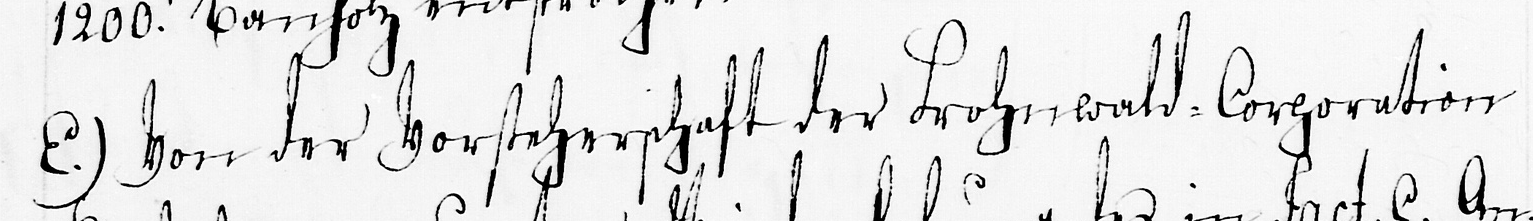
E.) Von der Vorsteherschaft der Frohnwald-Corporation
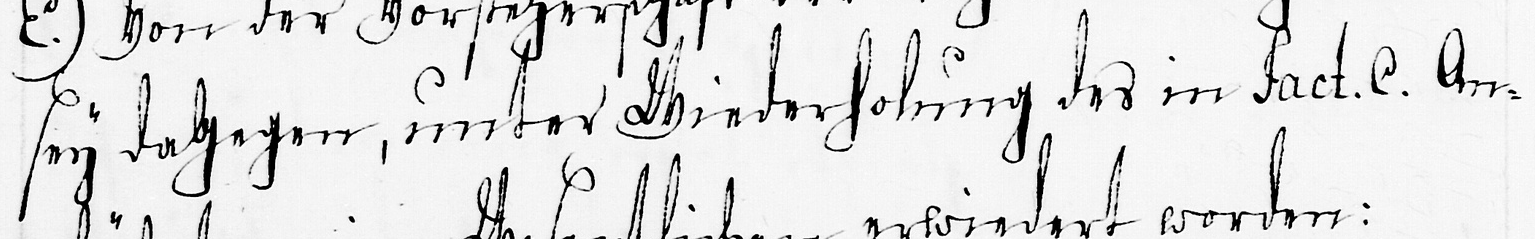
sey dagegen, unter Wiederholung des in Fact. C. An¬
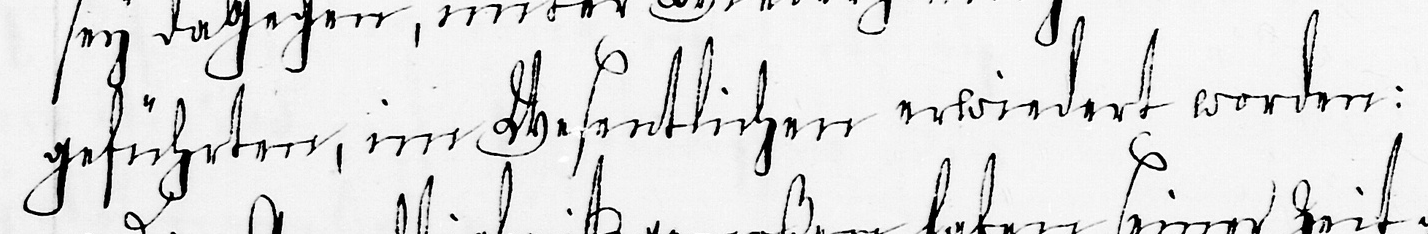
geführten, im Wesentlichen erwiedert worden:
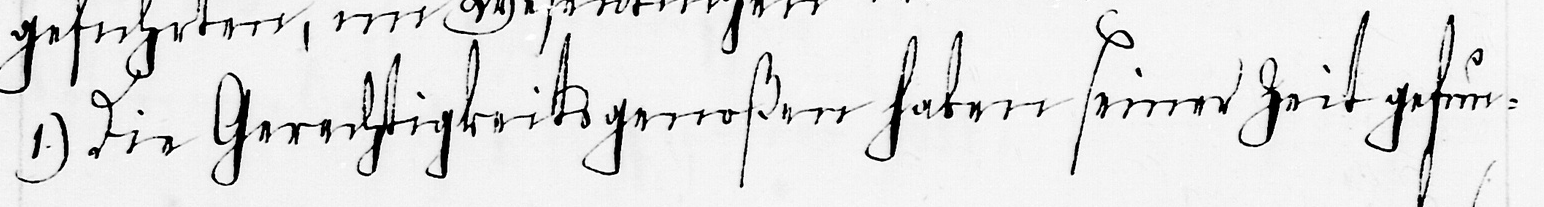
1.) Die Gerechtigkeitsgenoßen haben seiner Zeit gefun-
